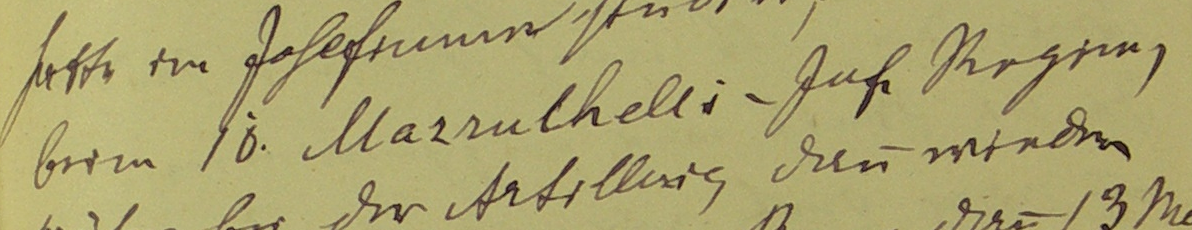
beim 10. Marrchelli—Inf. Regiment,
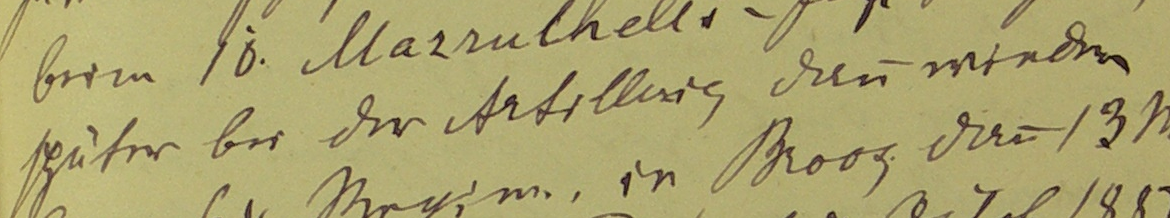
später bei der Artillerie , dann wieder
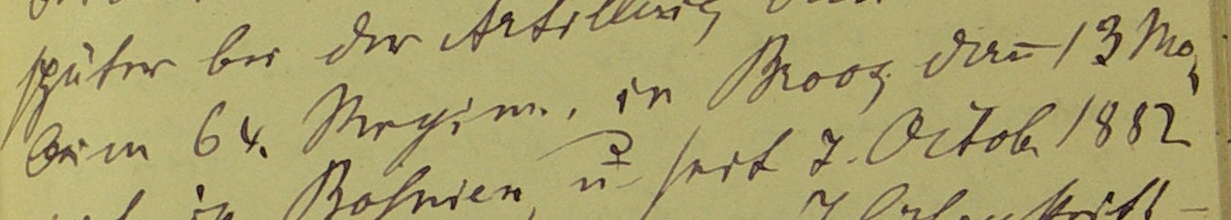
beim 64. Regiment in Broos, dann 13 Mo¬
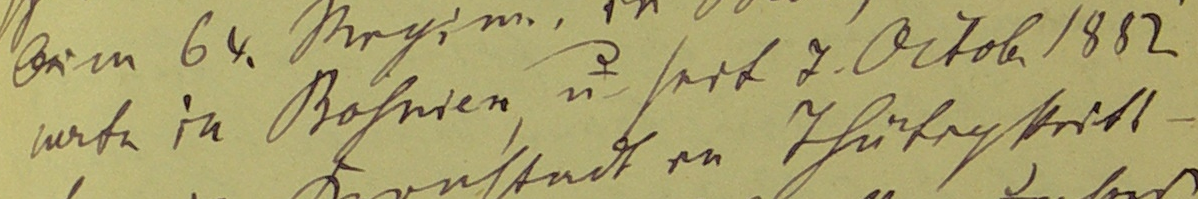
nate in Bosnien und seit 7. Okt. 1882
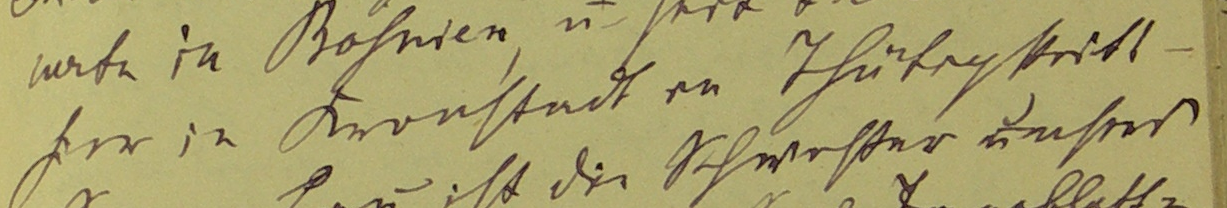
hier in Kronstadt in Thätigkeit. –
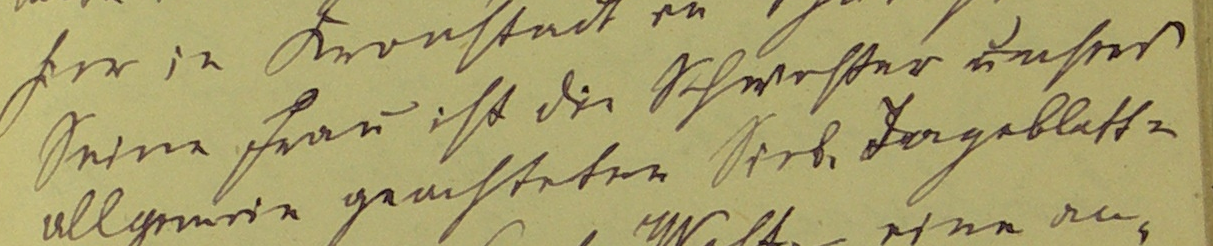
Seine Frau ist die Schwester unseres
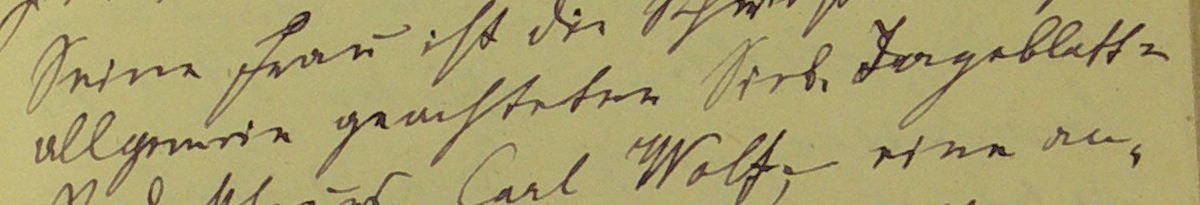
allgemein geachteten Sieb. Tageblatt
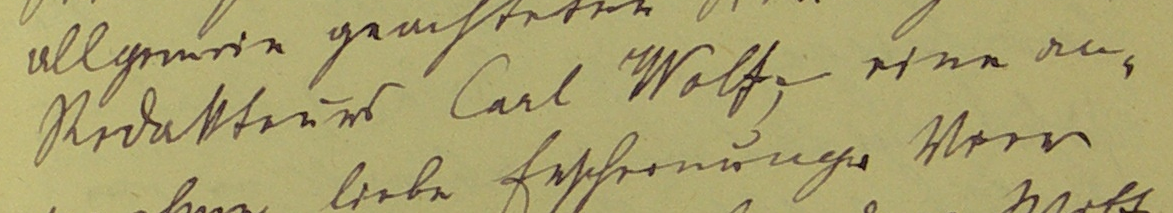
Redakteurs Carl Wolf, eine an¬
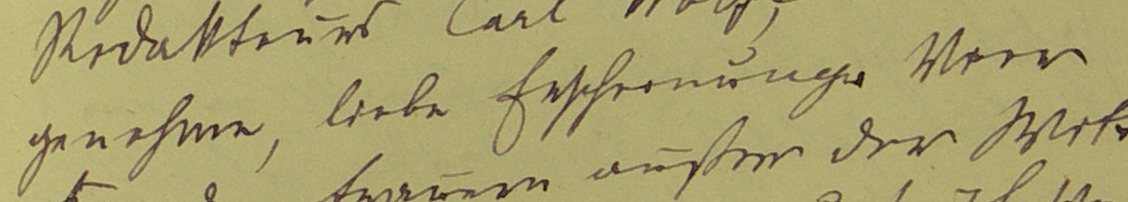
genehme, liebe Erscheinung. Vier
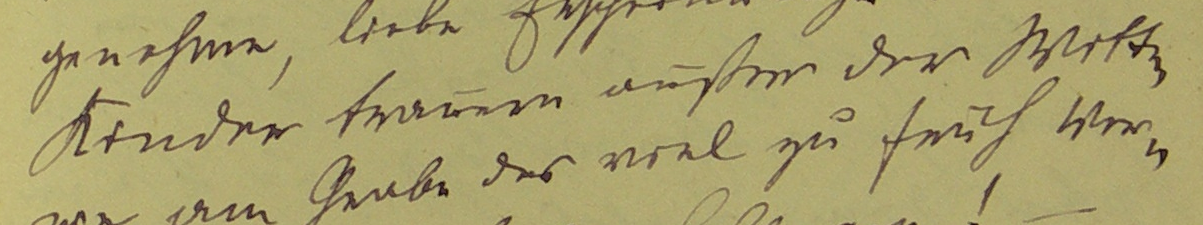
Kinder trauern außer der Wit¬
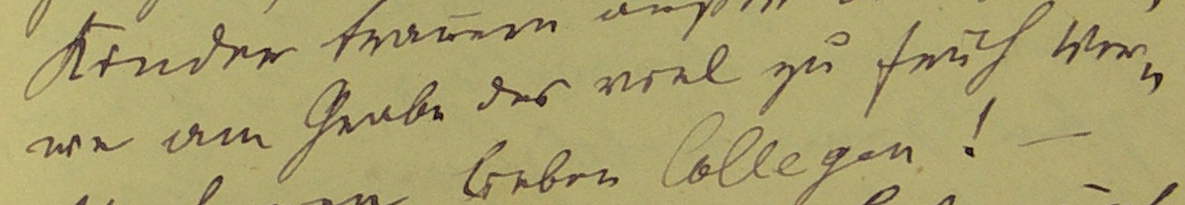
we am Grabe des viel zu früh ver¬
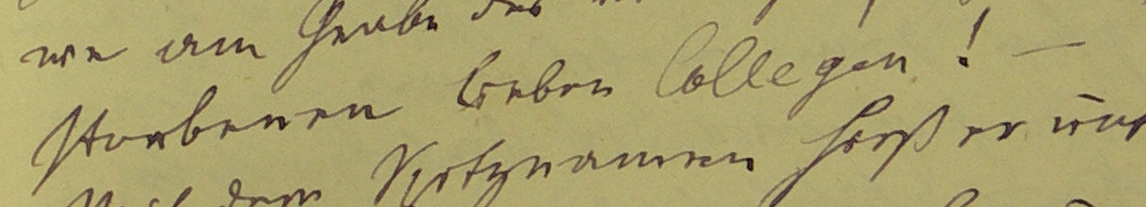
storbenen lieben Collegen !-
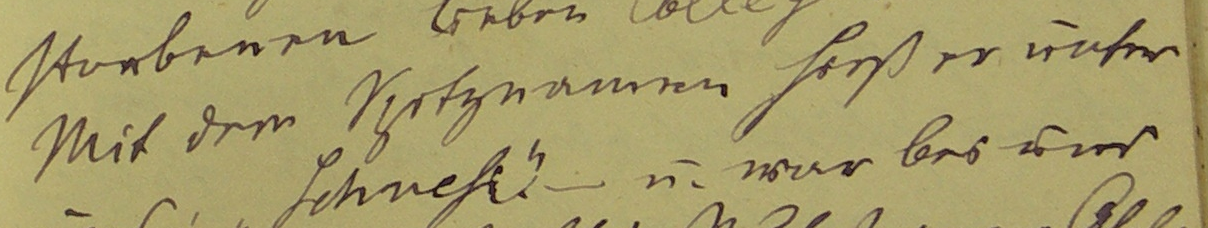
Mit dem Spitznamen hieß er unter
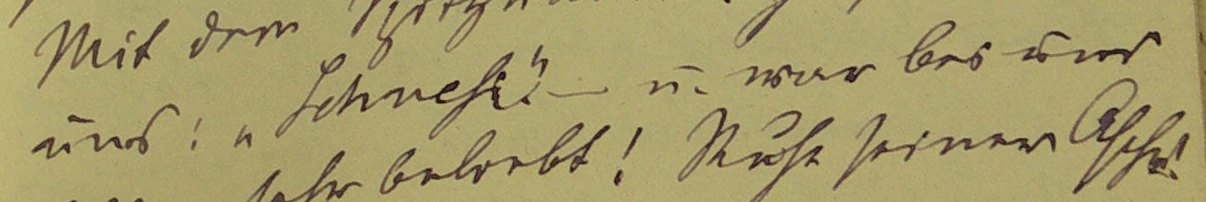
uns „Schnehi“- und war bei uns
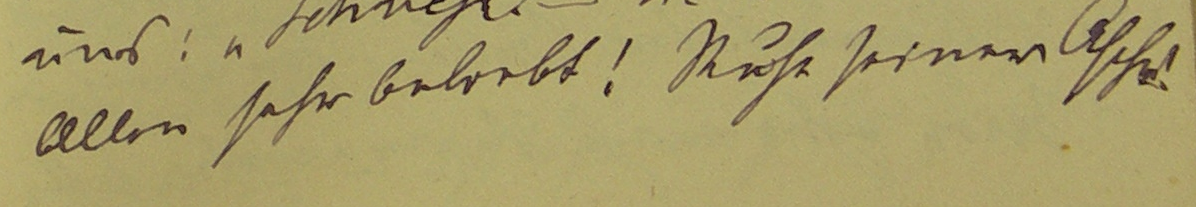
allen sehr beliebt!- Ruhe seiner Asche.
